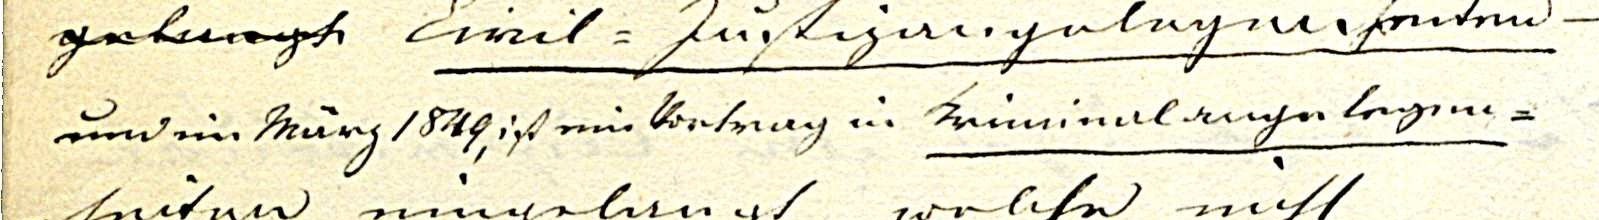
um im März 1849, ist ein Vortrag in Kriminalangelegen–
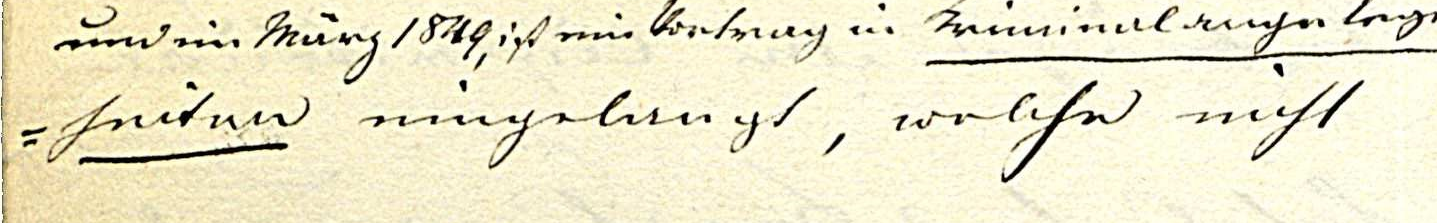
heiten eingelangt, welche nicht
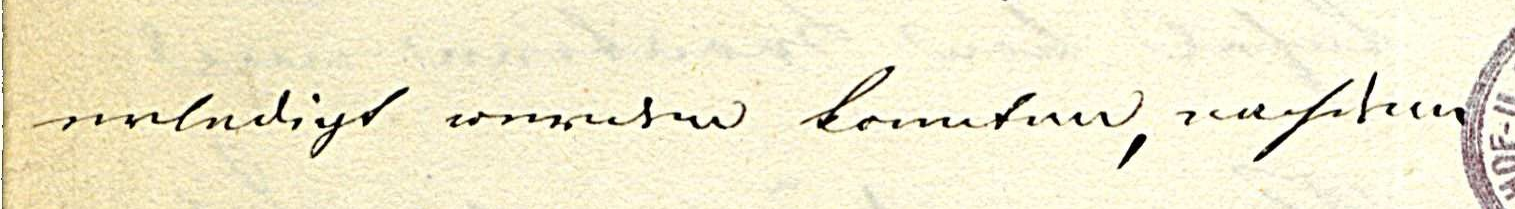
erledigt werde konnten, nachdem
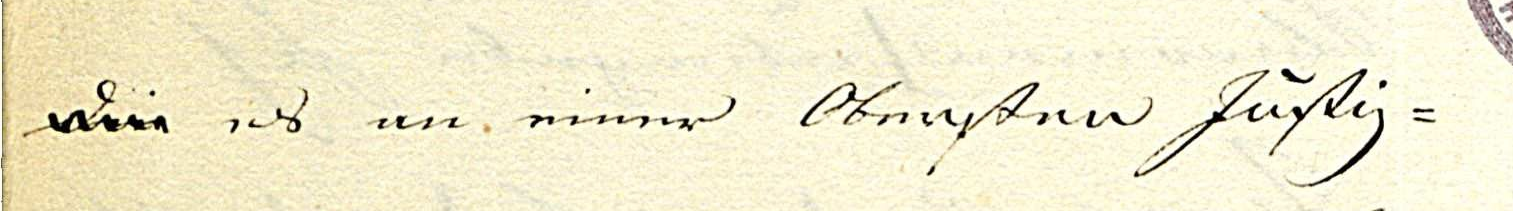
es an einer Obersten Justiz¬
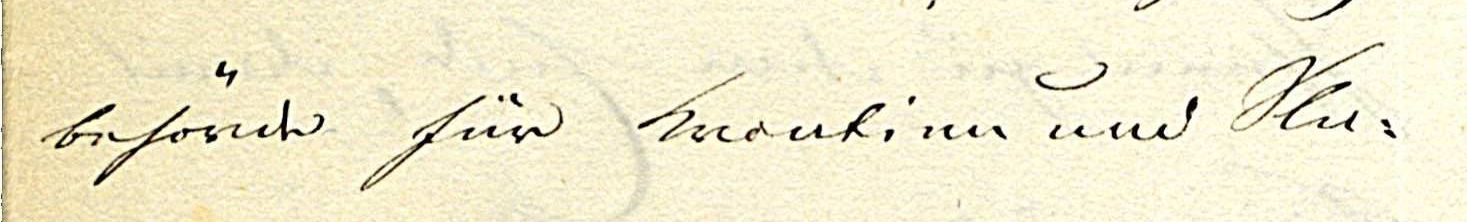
behörde für Kroatien und Sla¬
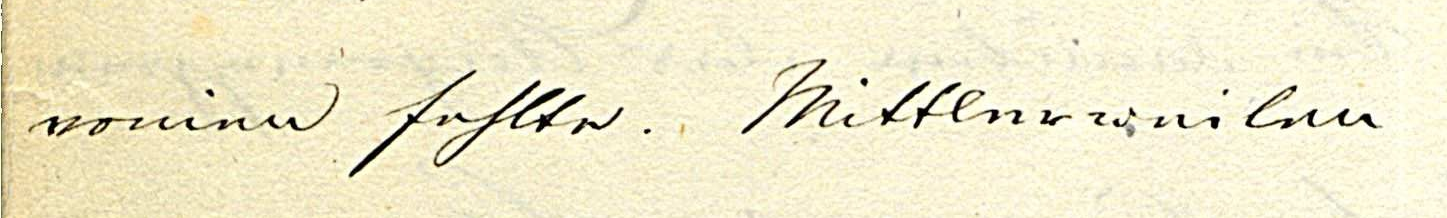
vonien fehlte. Mittlerweilen
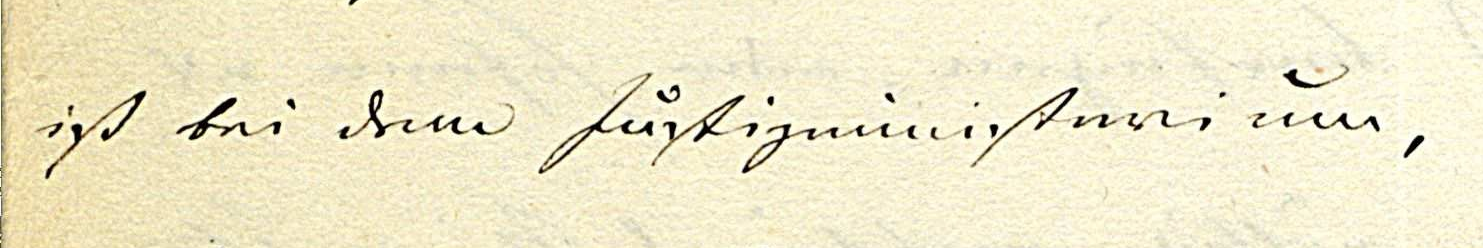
ist bei dem Justizministerium,
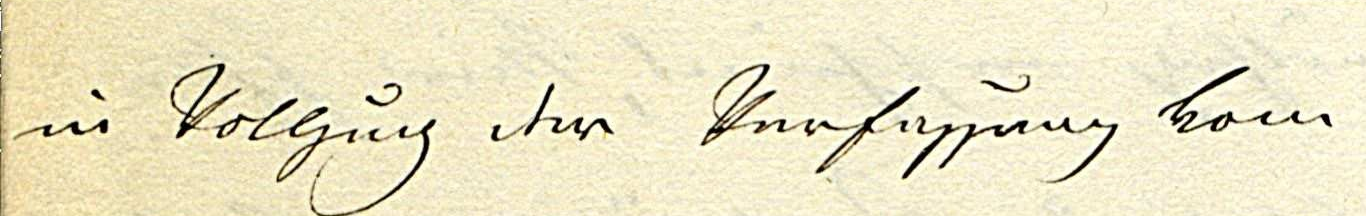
in Vollzug der Verfassung vom
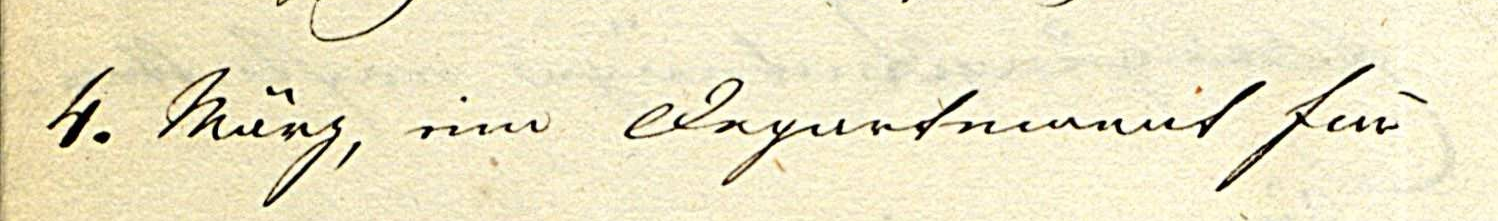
4. März, ein Departement für
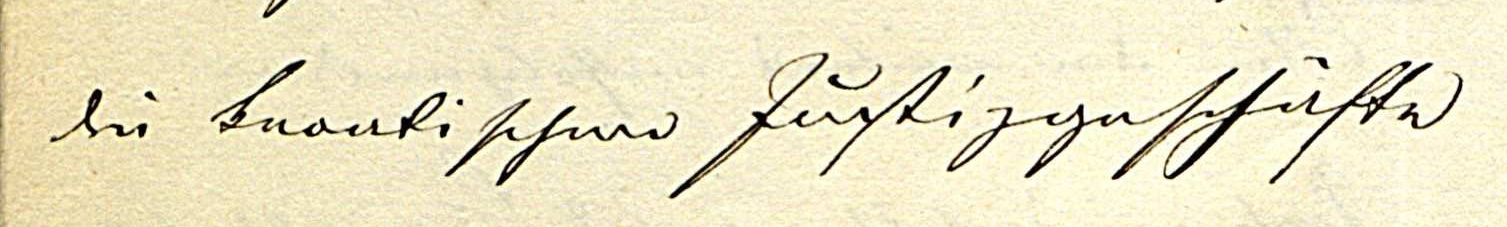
die kroatischen Justizgeschäfte
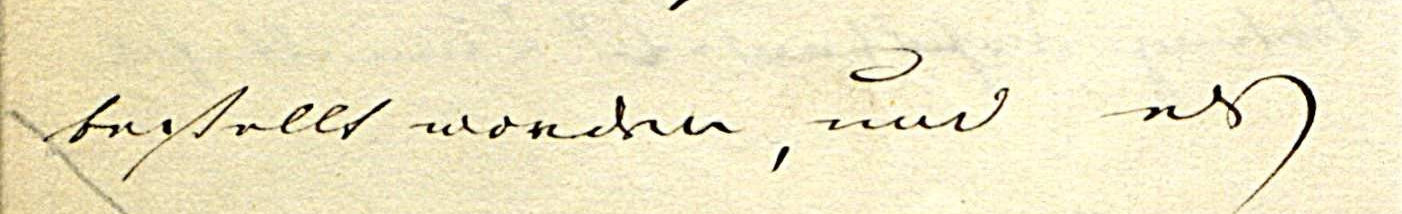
bestellt worden, und es
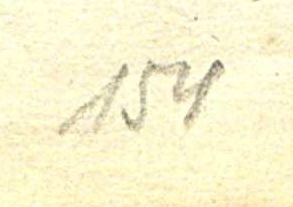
154
